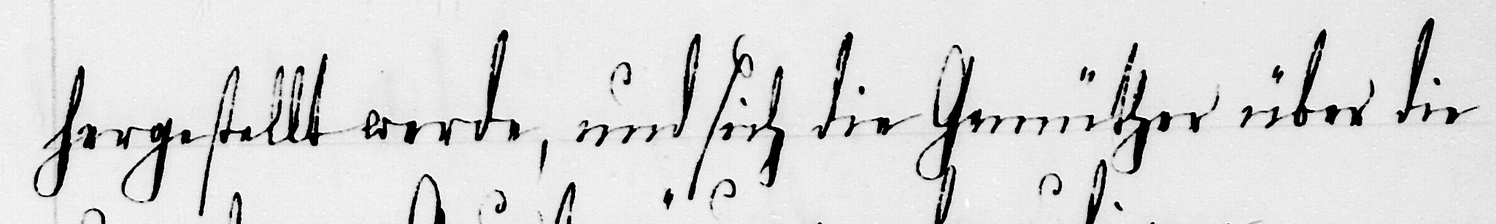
hergestellt werde, und sich die Gemüther über die
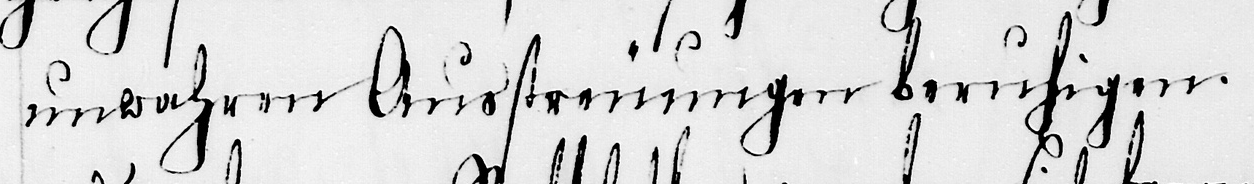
unwahren Ausstreüungen beruhigen.
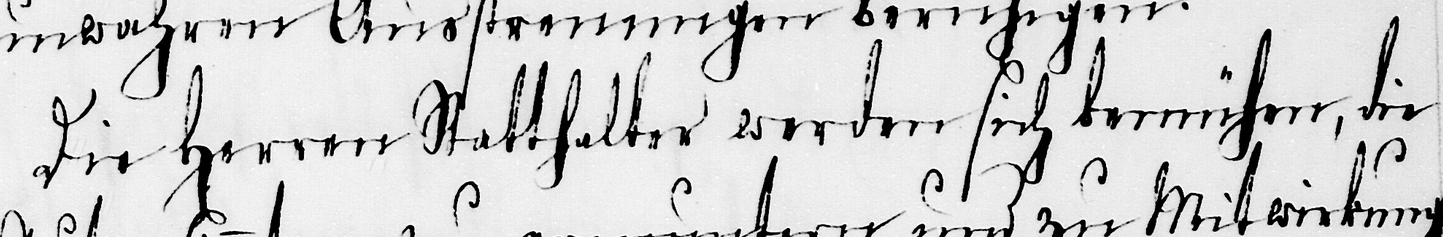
Die Herren Statthalter werden sich bemühen, die
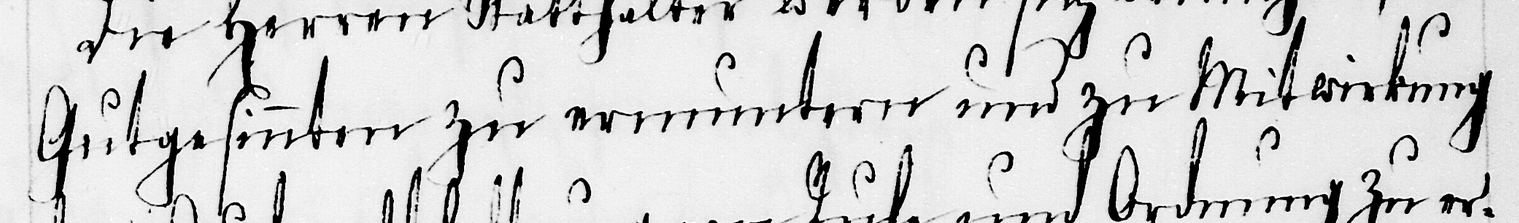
Gutgesinnten zu ermuntern und zu Mitwirkung
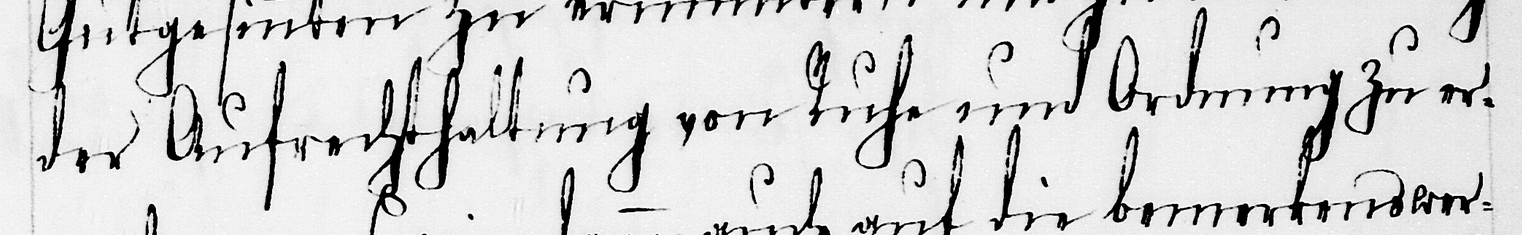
der Aufrechthaltung von Ruhe und Ordnung zu er¬
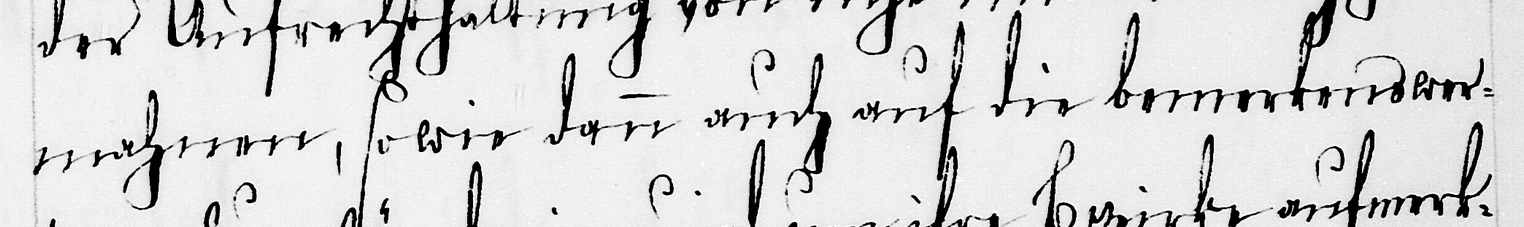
mahnen, so wie dann auch auf die bemerkenswer¬
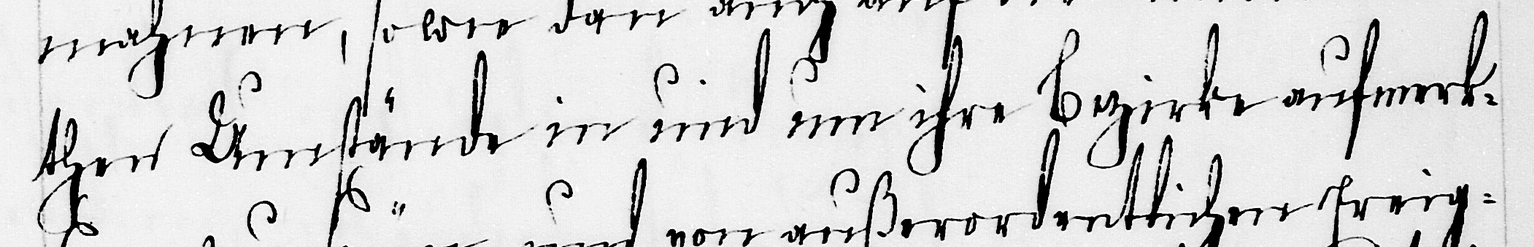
then Umstände in und um ihre Bezirke aufmerk¬
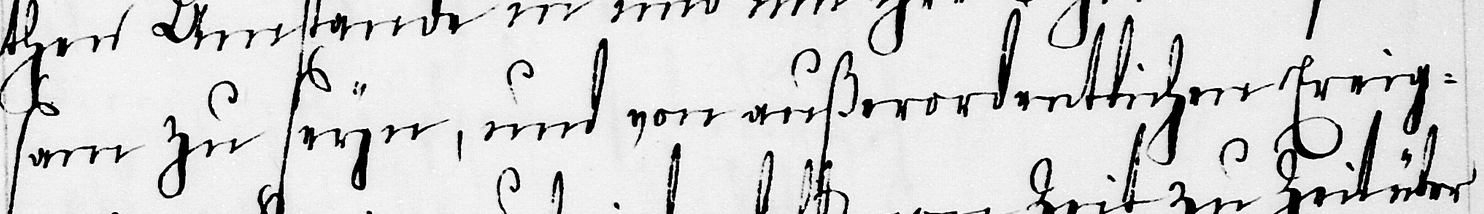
sam zu seyn, und von außerordentlichen Ereig¬
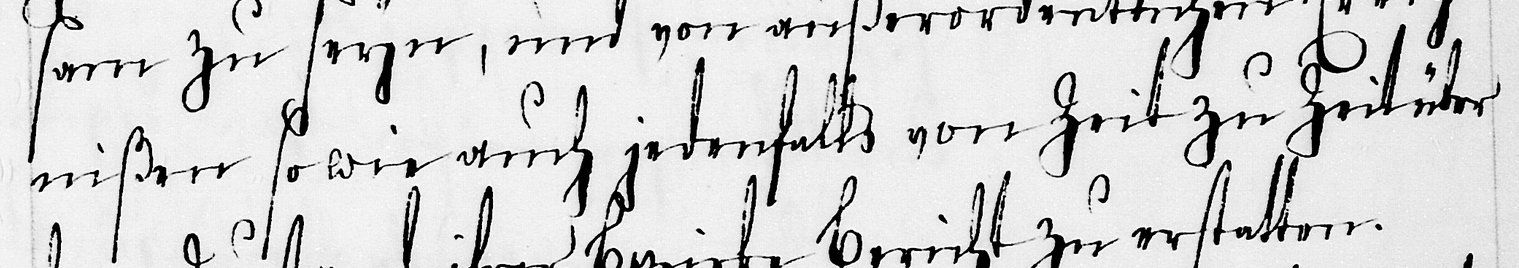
nißen so wie auch jedenfalls von Zeit zu Zeit über
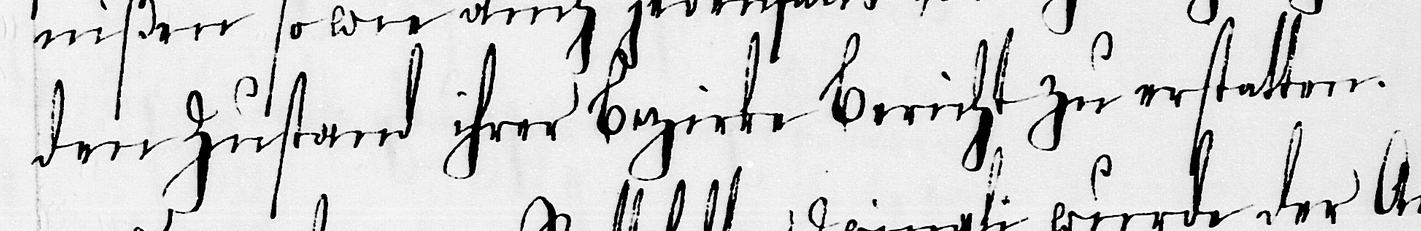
den Zustand ihrer Bezirke Bericht zu erstatten.
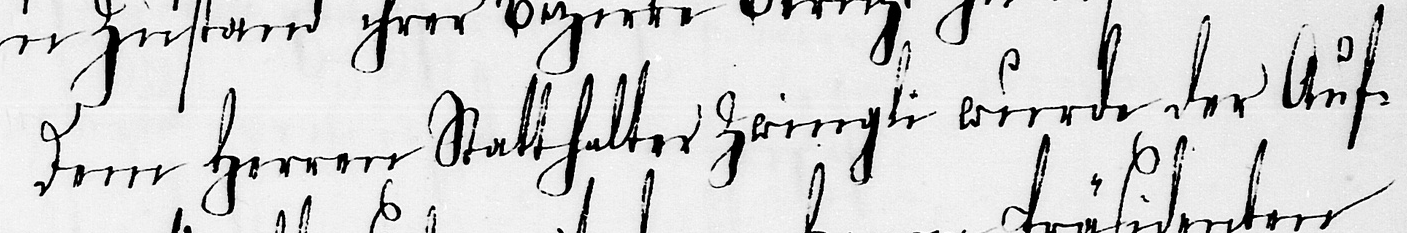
Dem Herren Statthalter Zwingli wurde der Auf¬
